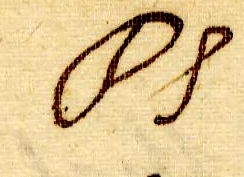PS
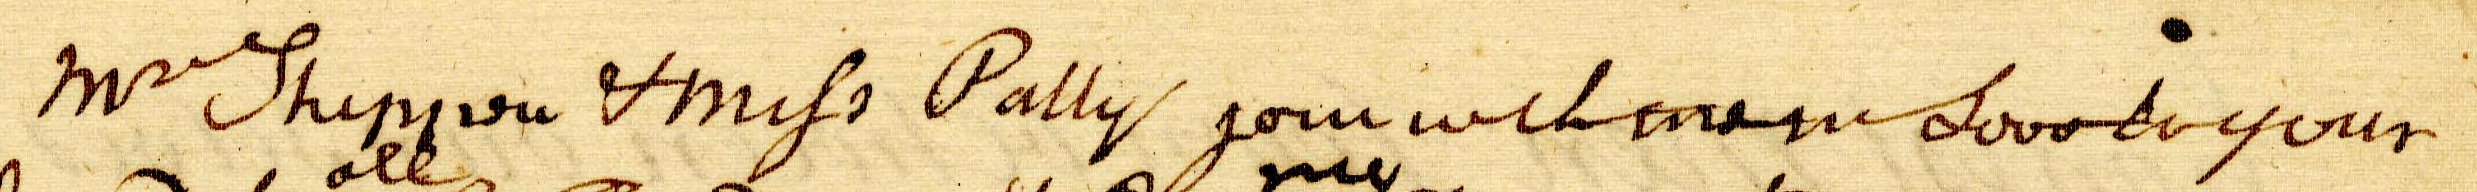M^rs Shippen & Miss Patty join with me in Love to your
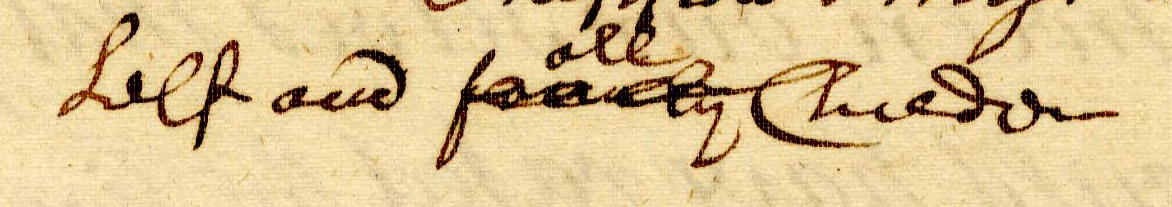Self and all Children
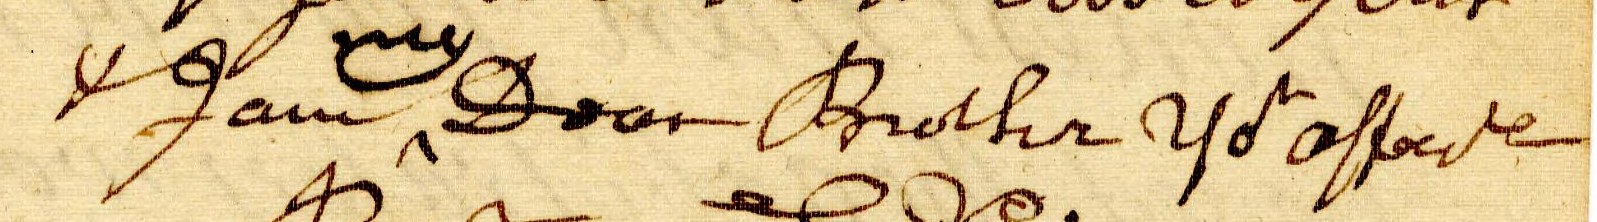& I am ^my Dear Brother Yo^r Affec^te
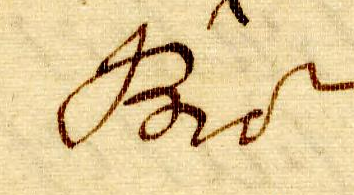Bro^r
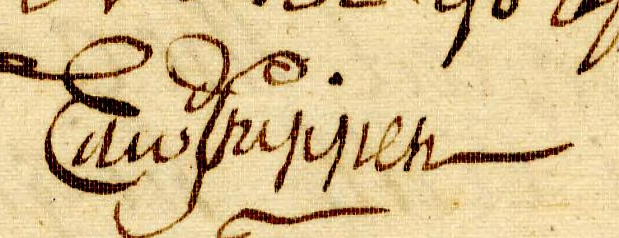Edw^d Shippen
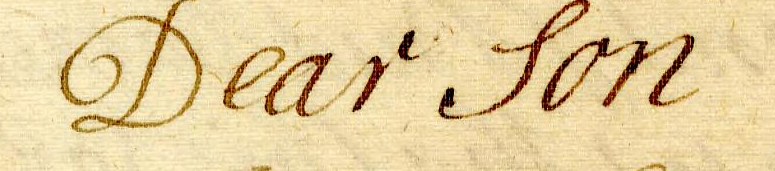Dear Son
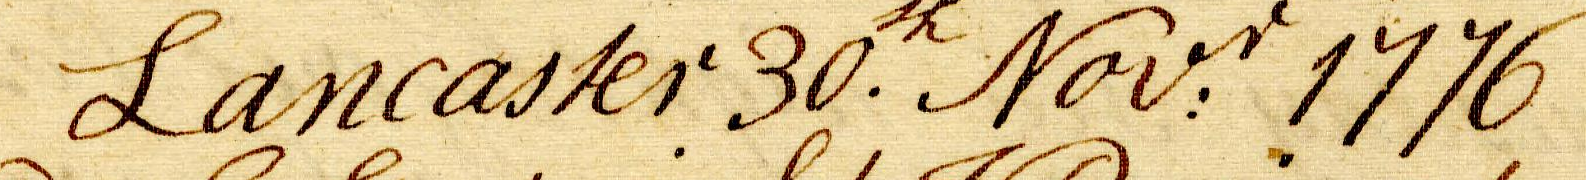Lancaster 30^th. Nov^r: 1776
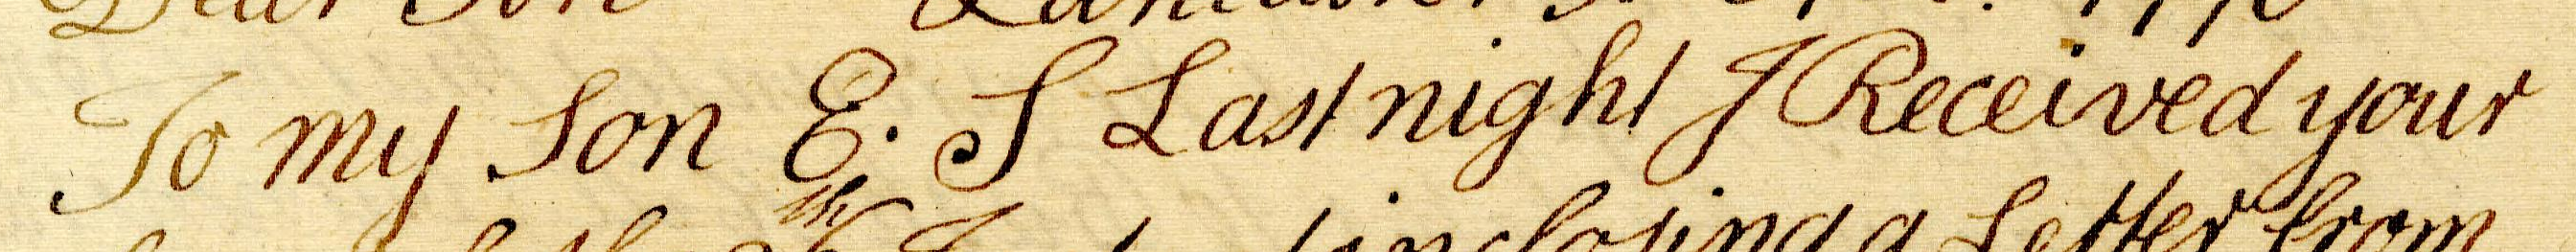To my Son E. I Last night I Received your
